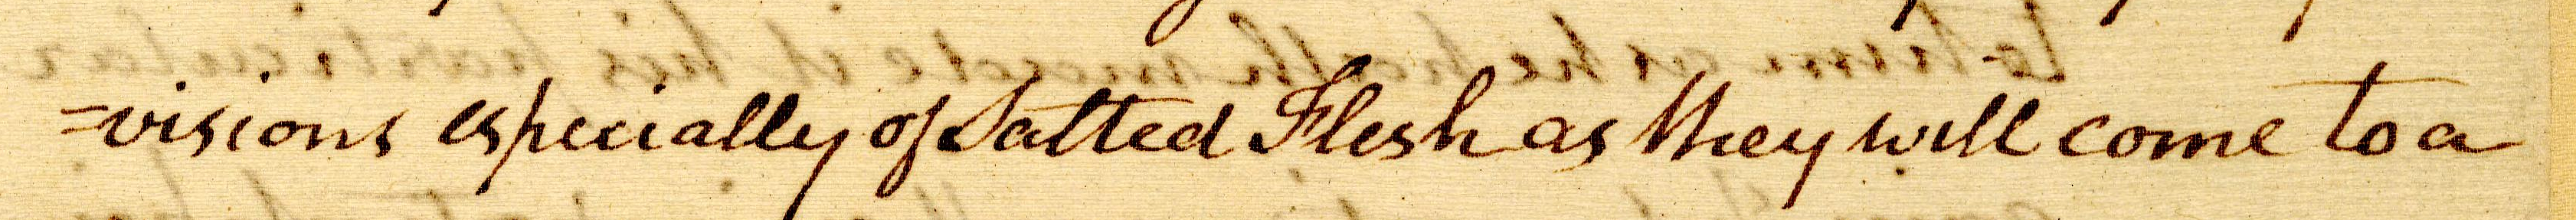-visions especially of Salted Flesh as they will come to a
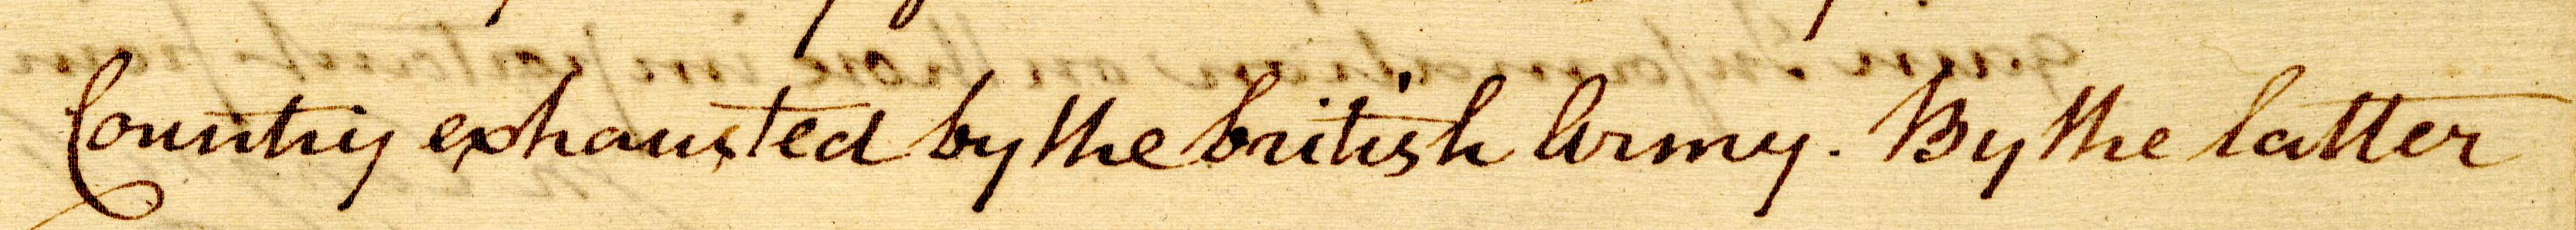Country exhausted by the british Army. By the latter
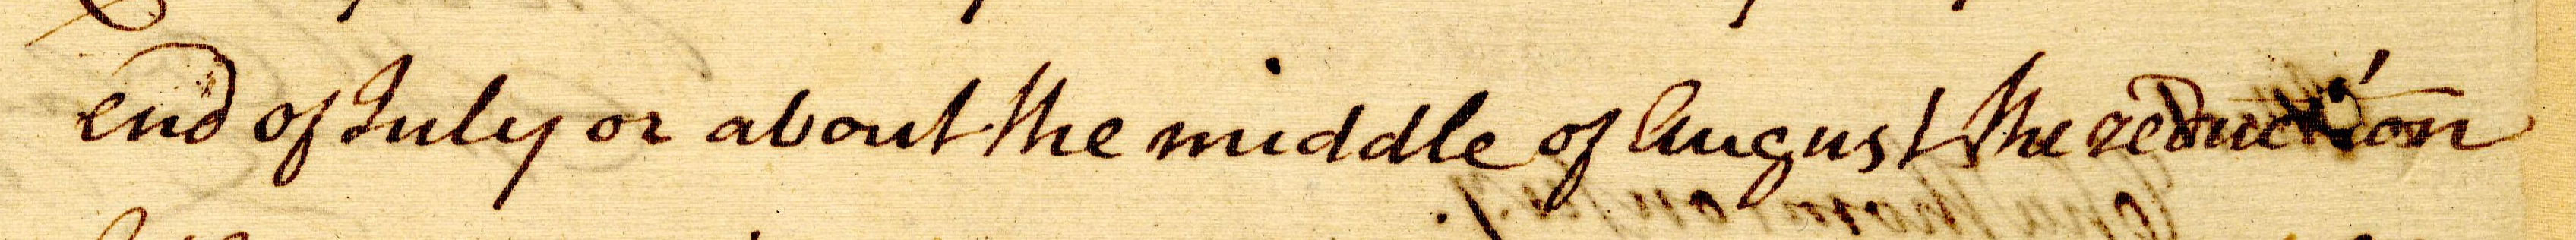end of July or about the middle of August the reduction
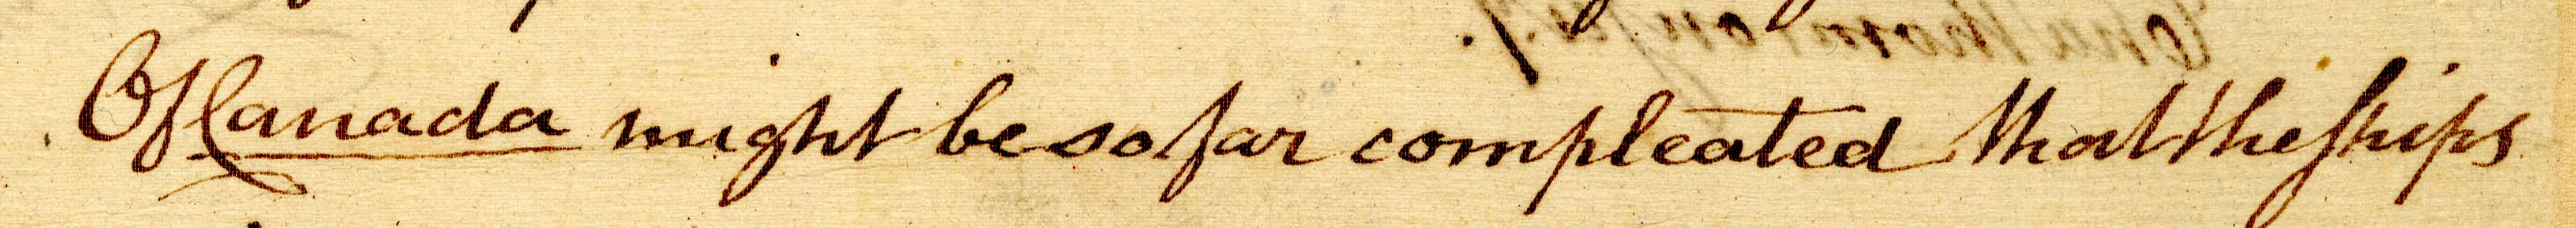Of Canada might be so far compleated that the ships
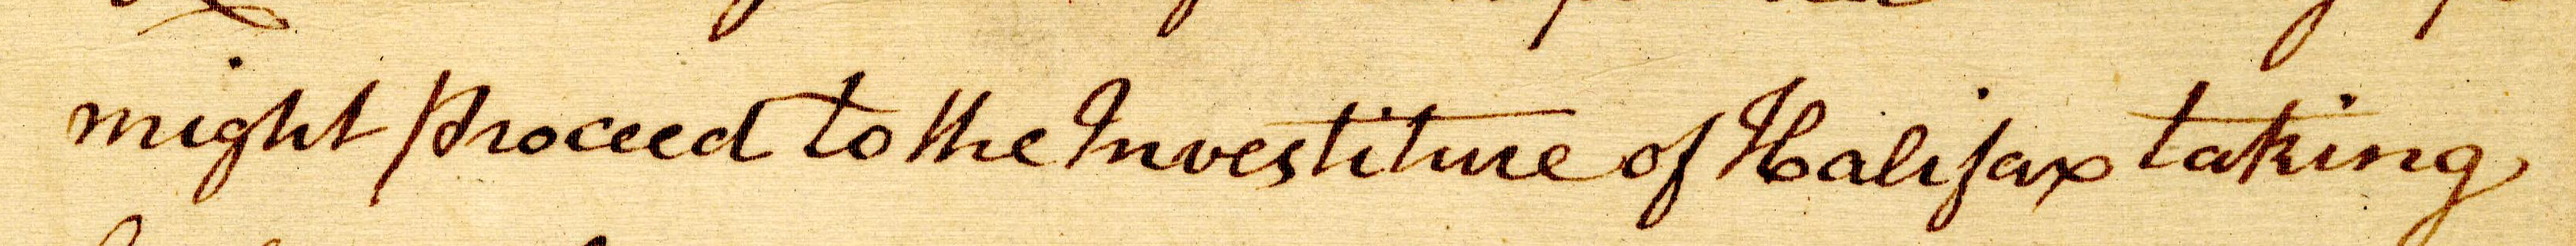might proceed to the Investiture of Halifax taking
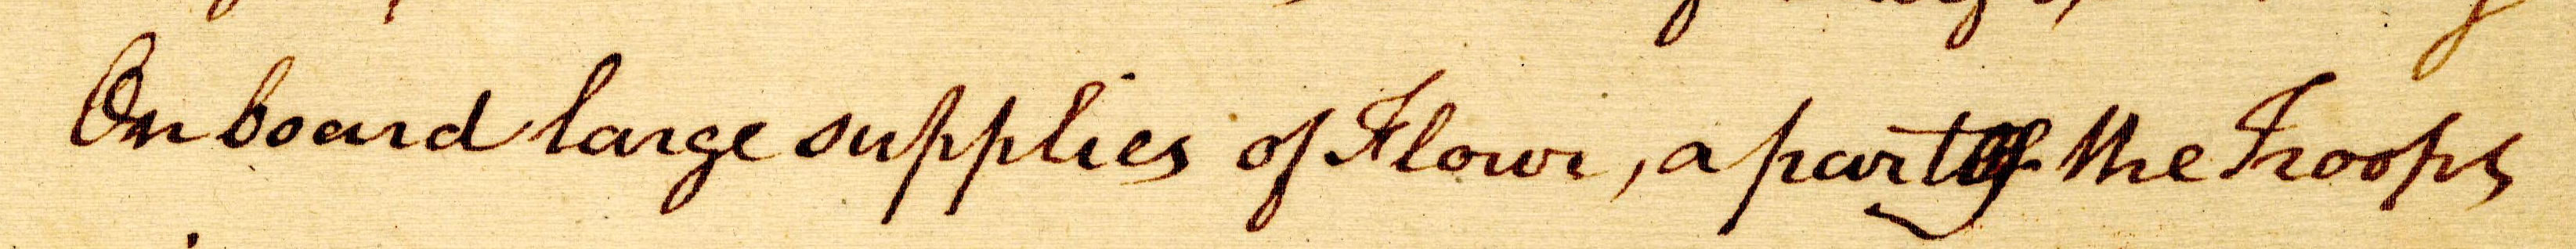Onboard large supplies of Flour, a party of the Troops
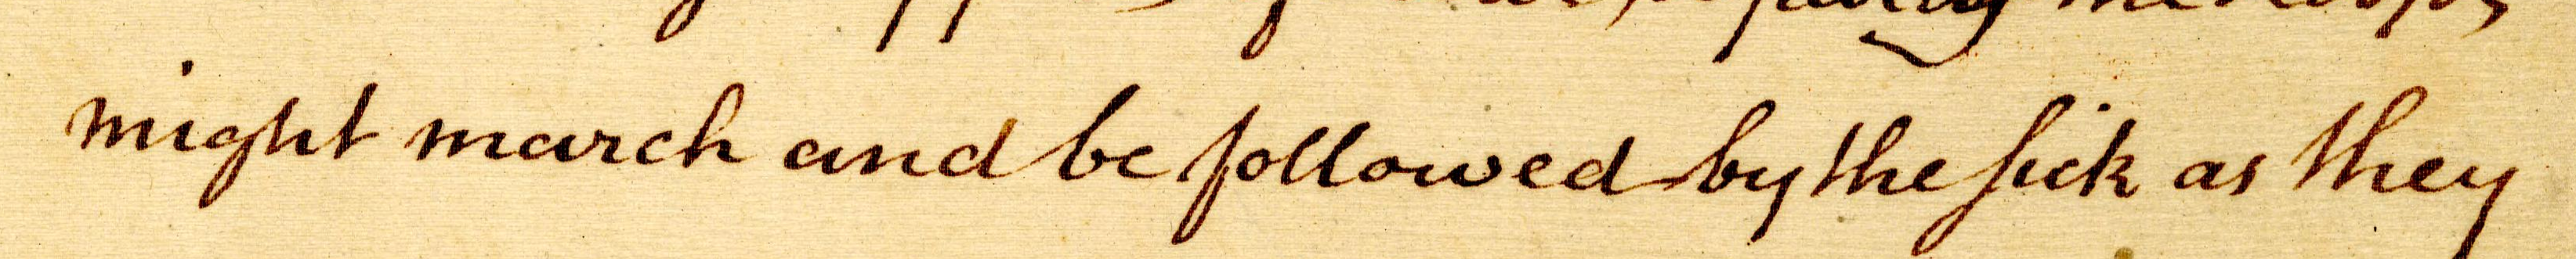might march and be followed by the sick as they
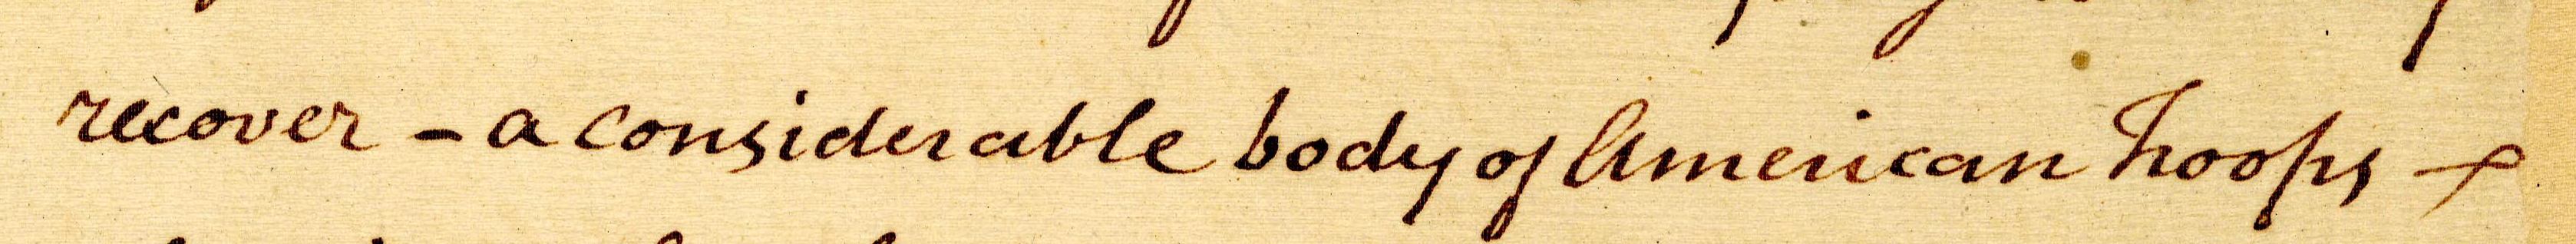recover- a considerable body of American Troops-
